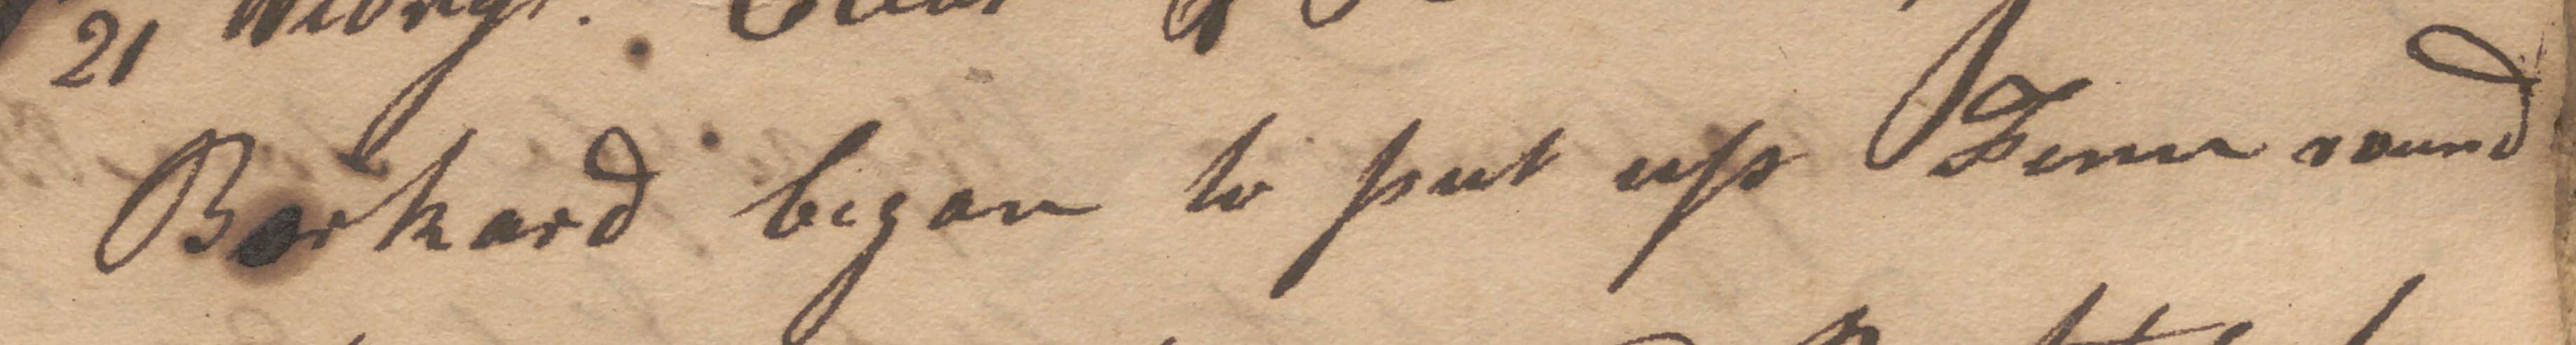Borkard began to put up Fence round
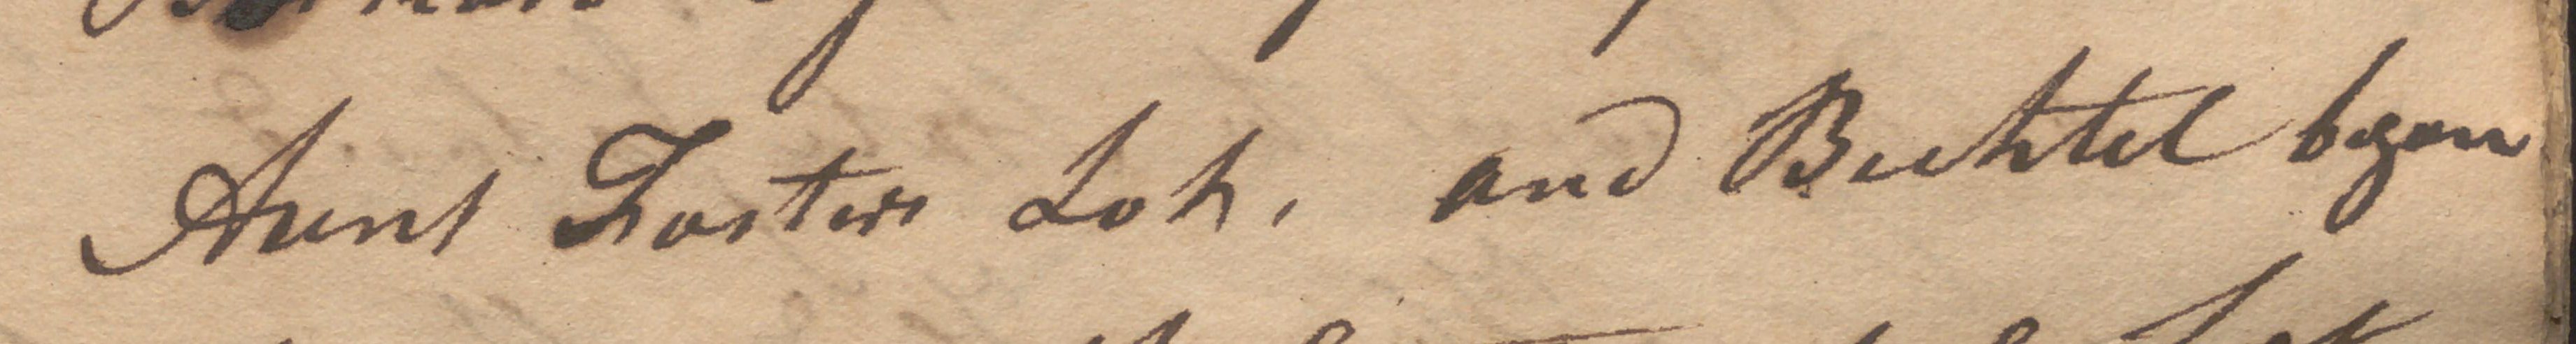Aunt Fosters Lot, and Bechtel began
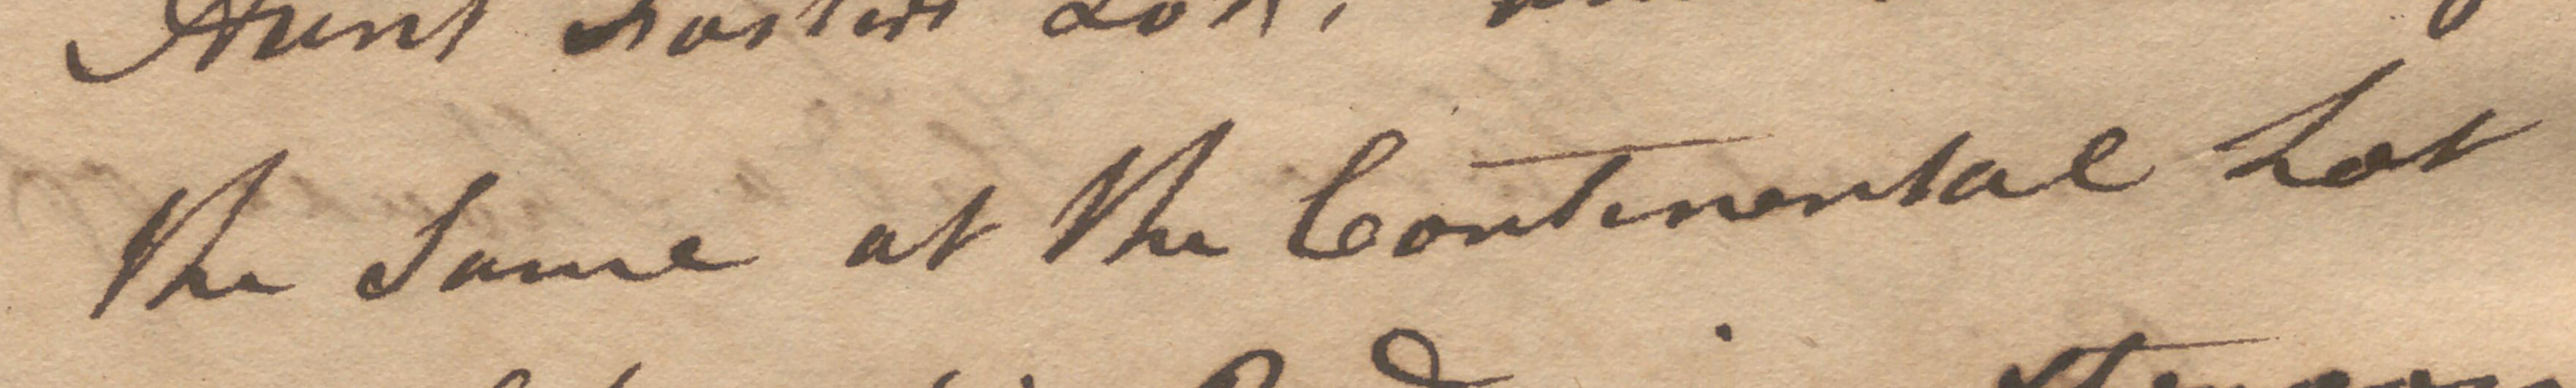the Same at the Continental Lot
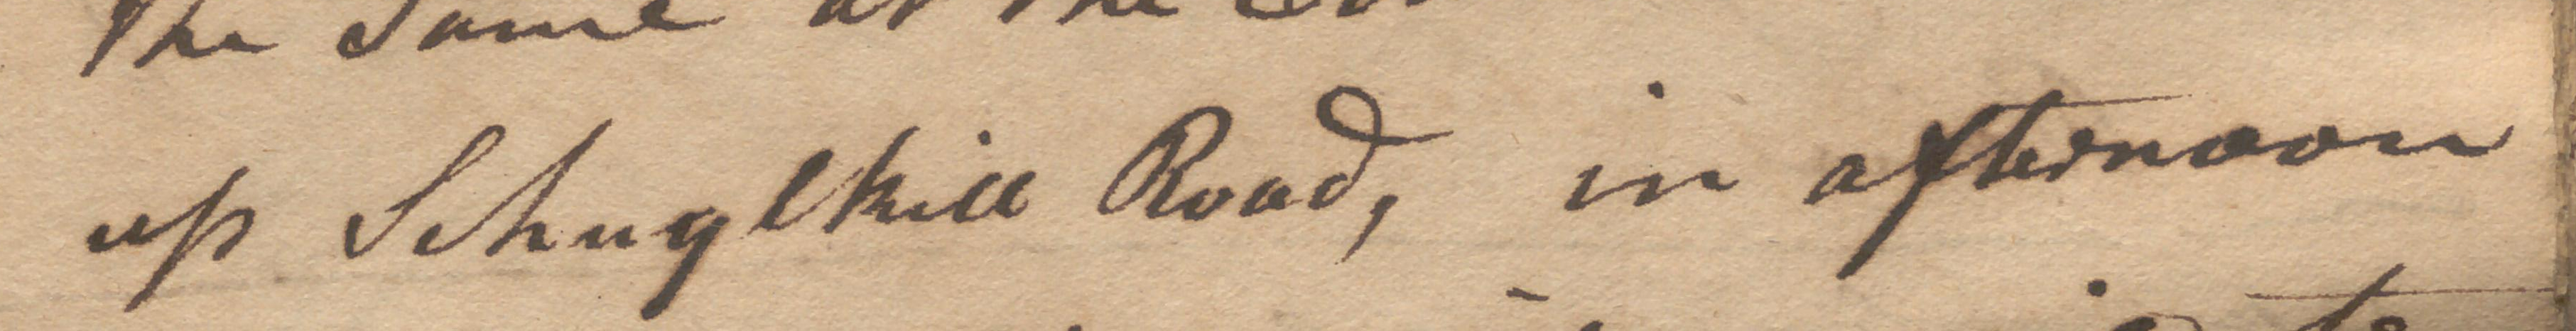up Schuylkill Road, in afternoon
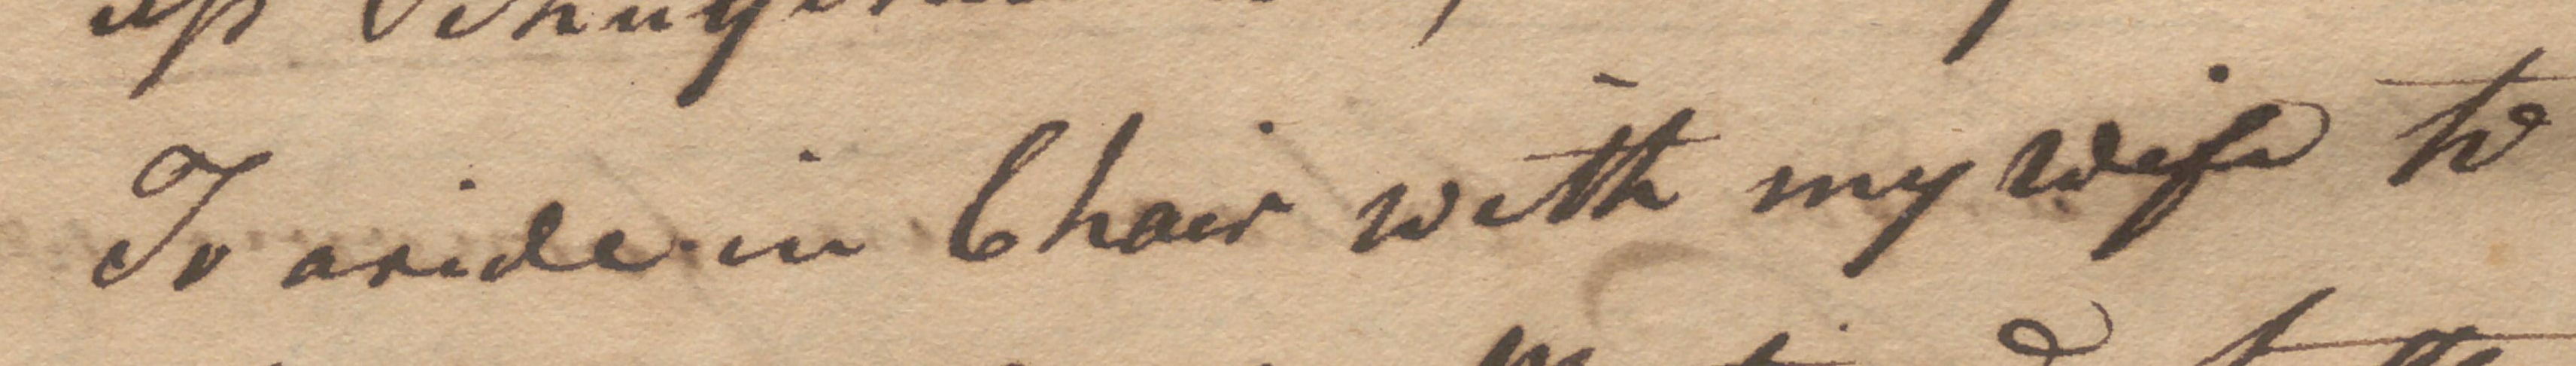To a ride in Chair with my wife to
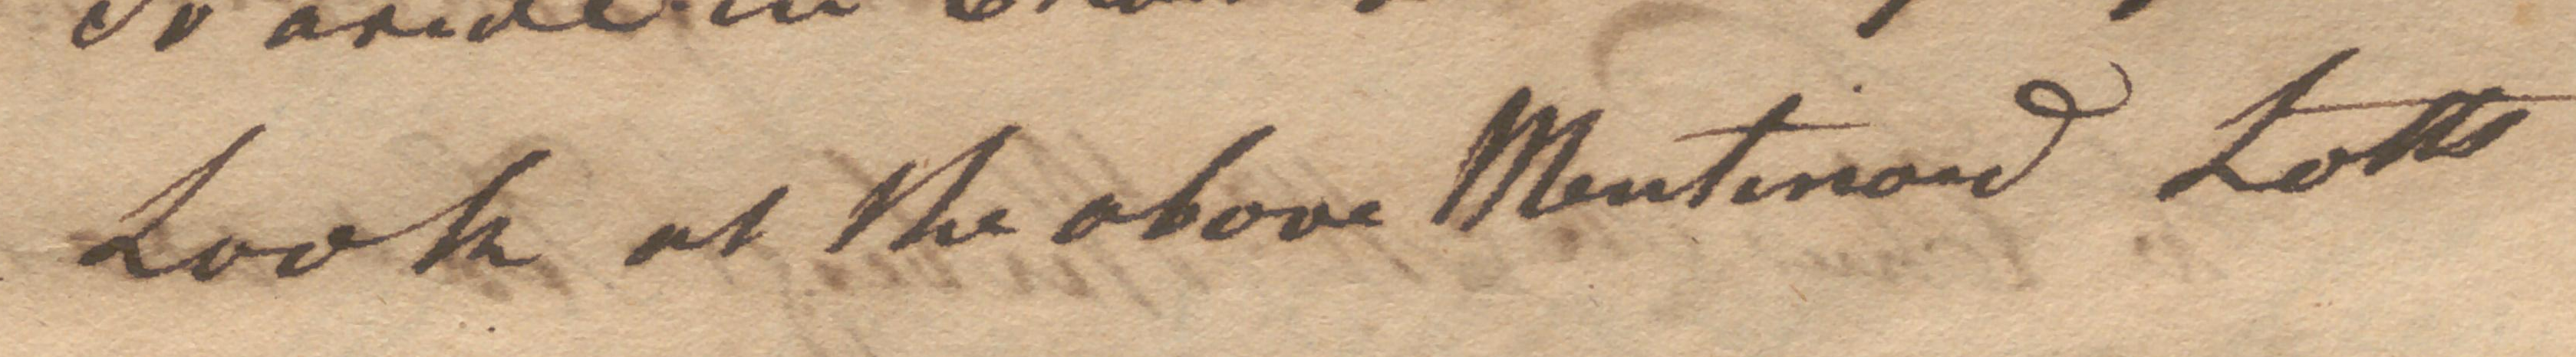Look at the above Mentiond Lotts
